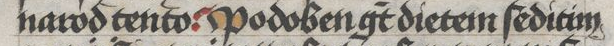narod tento?Podoben ḡt dietem ſedícim
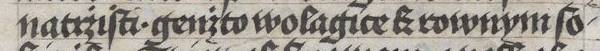natrżiẛti.genżto wolagíce k rownym ſo¬
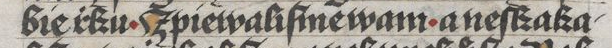bie ṙku.Zpíewali ſme wam.a neſkaka¬
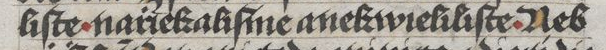liſte.naṙiekali ſme anekwieliſte.Neb
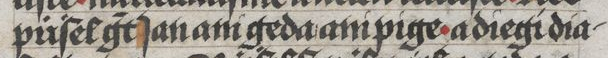pṙiẛel ḡt Ian ani geda ani pige.a diegí dia¬
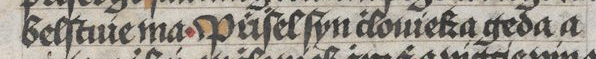belſtuie ma.Pṙiẛel ſyn ċlouieka geda a
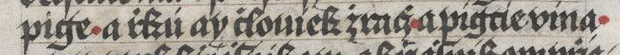pige.a ṙkú ay ċlouiek żracż.a pigtie vína.
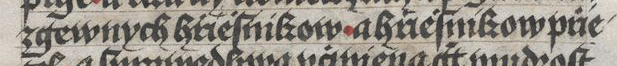zgewnych hṙieẛnikow.a hṙieẛníkow pṙíe¬
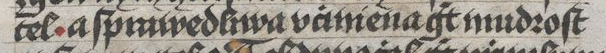tel.a ſprawedliwa vċiniena ḡt mudroſt
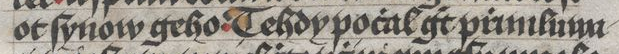ot ſynow geho.Tehdy poċal ḡt pṙimluwa¬
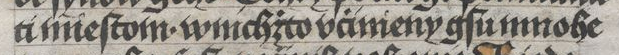ti mieſtom.wnichżto uċínieny gſu mnohe
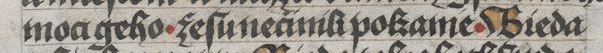moci geho.żeſu neċinili pokanie.Bieda
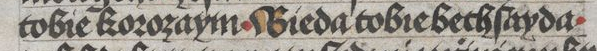tobie korozaym.Bieda tobie bethſayda.
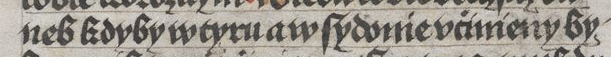neb kdyby w tyru a w ſydonie vċinieny by¬
